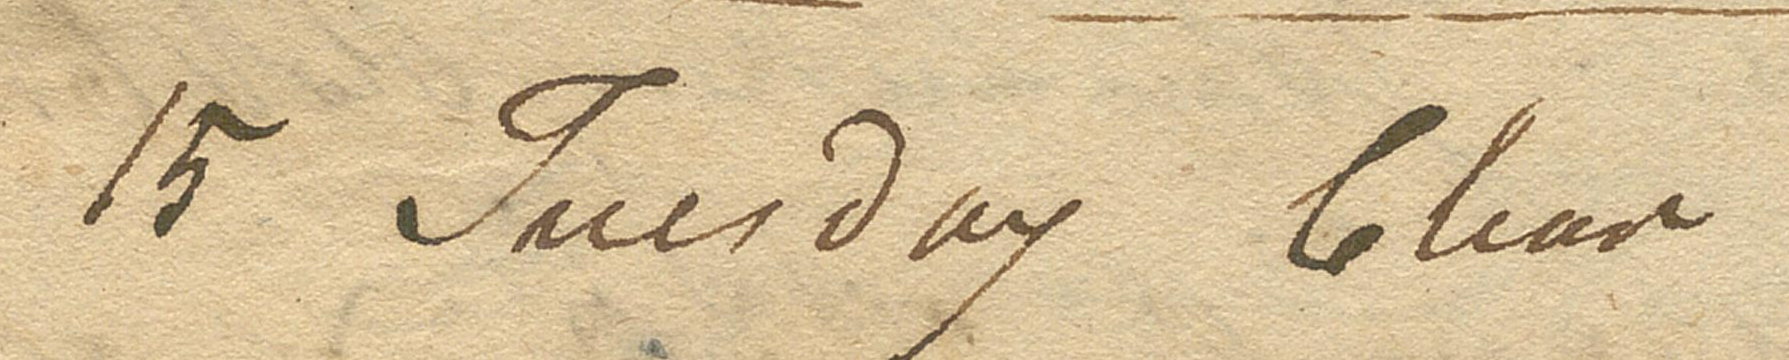15 Tuesday Clear
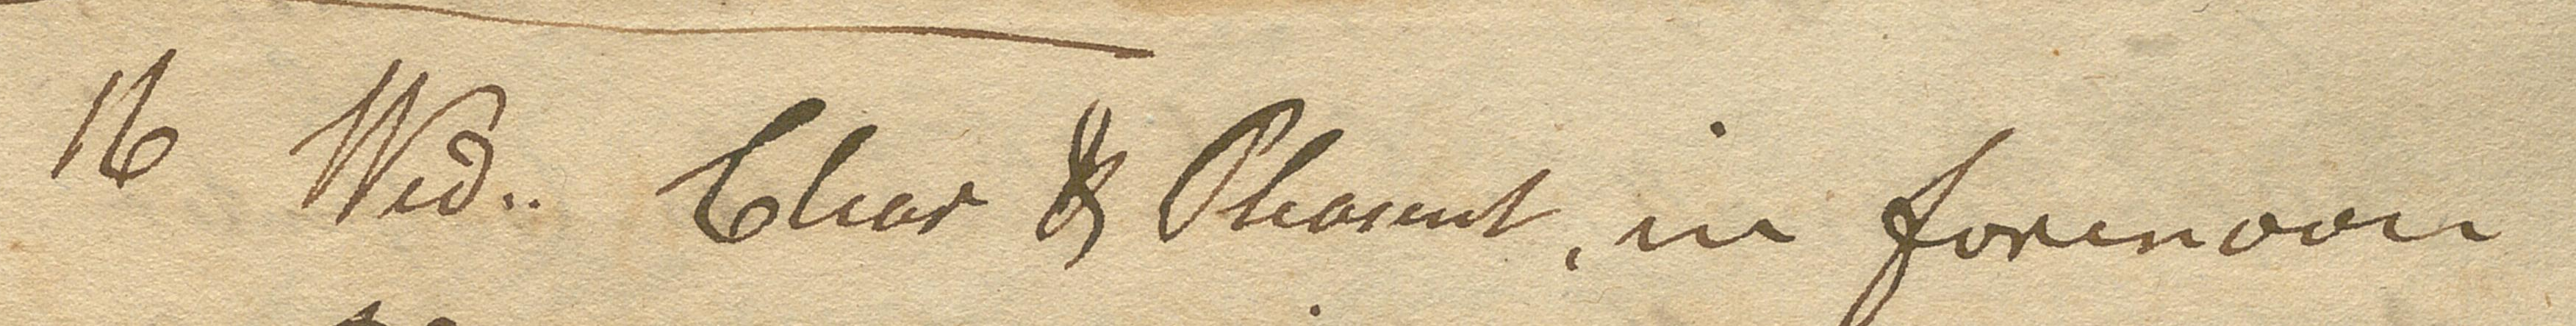16 Wed.. Clear & Pleasent, in forenoon
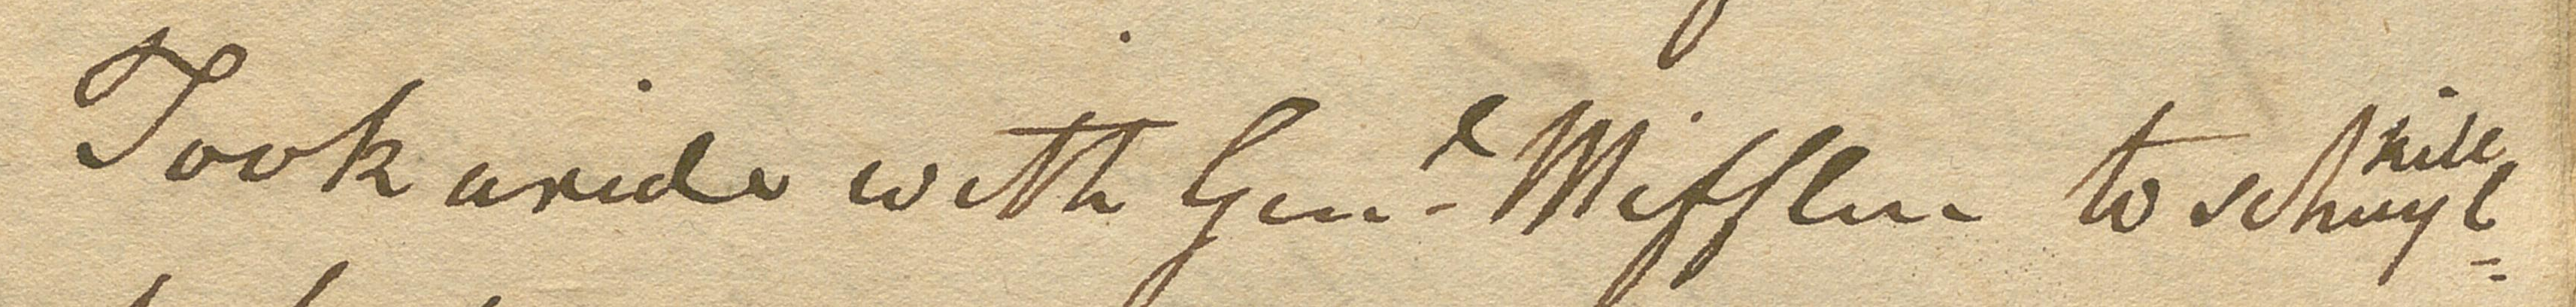Took a ride with Gen^l. Mifflin to Schuyl-^kill
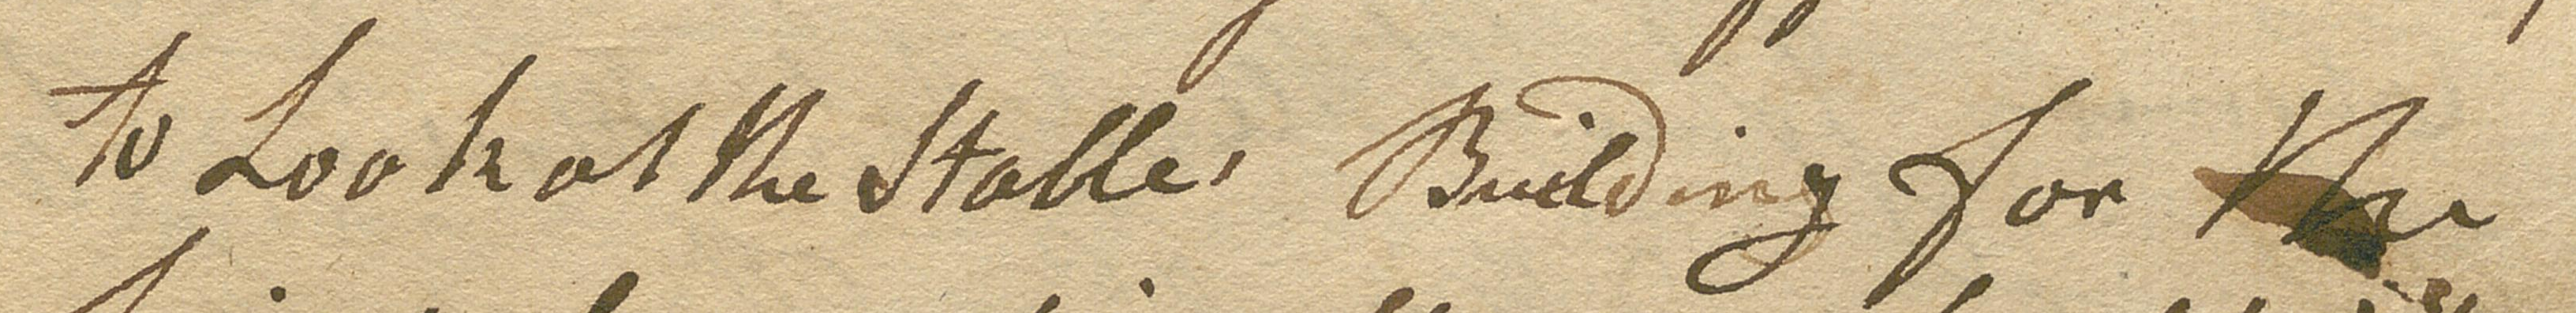to Look at the Stables Building for the
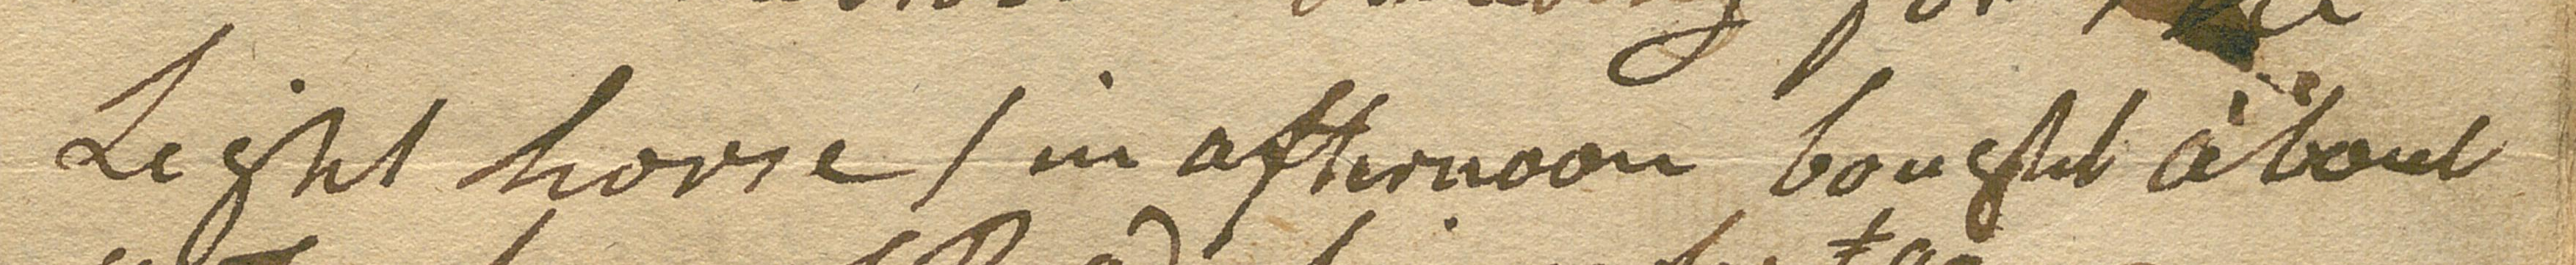Light hoose / in afternoon bought about
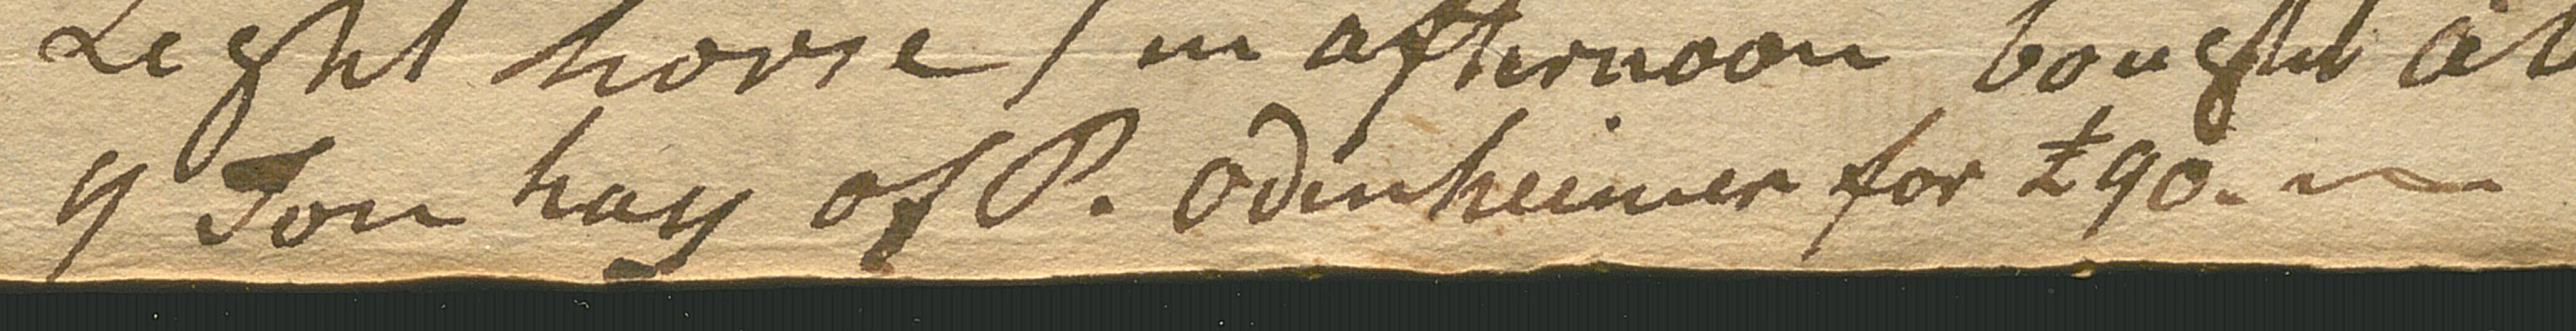9 Ton hay of P. odenheimer for £90.-
